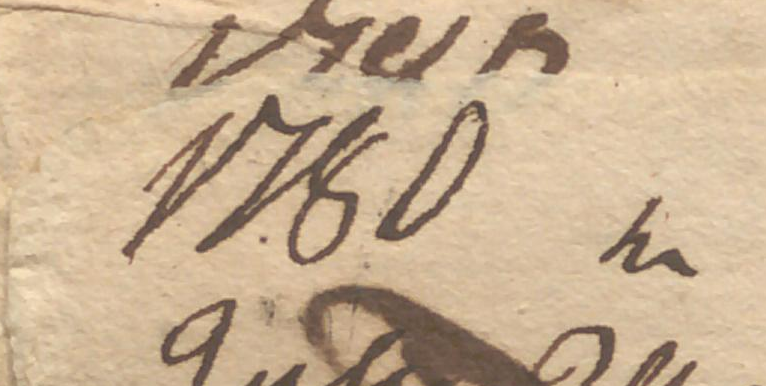1780
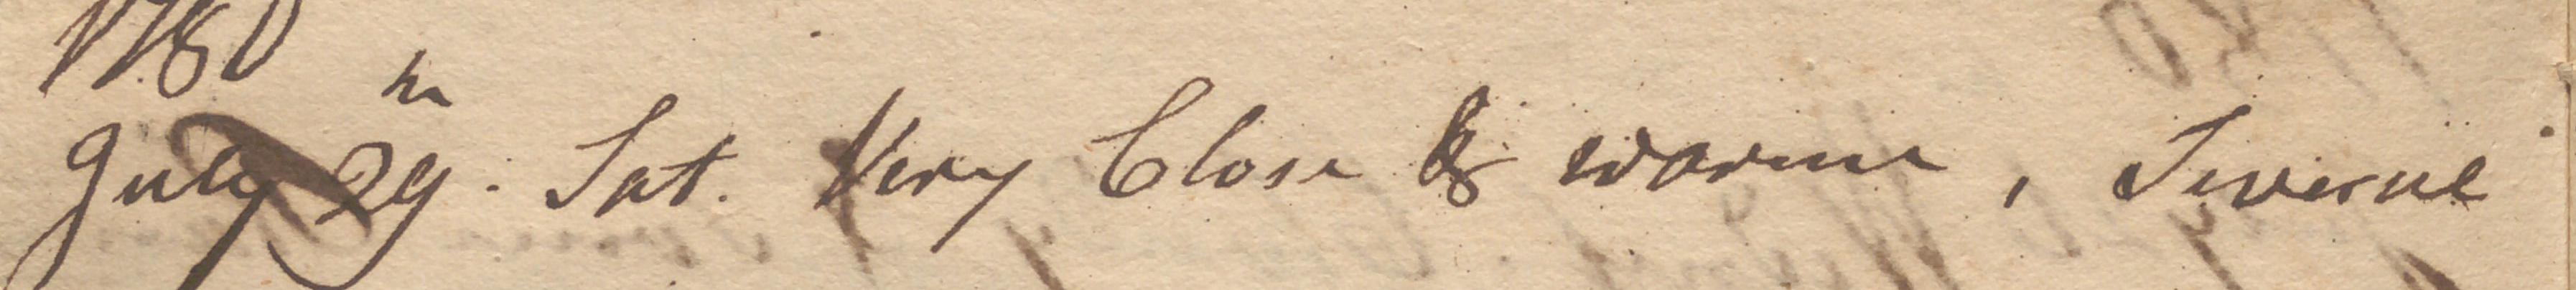July 29^th. Sat. Very Close & warme, several
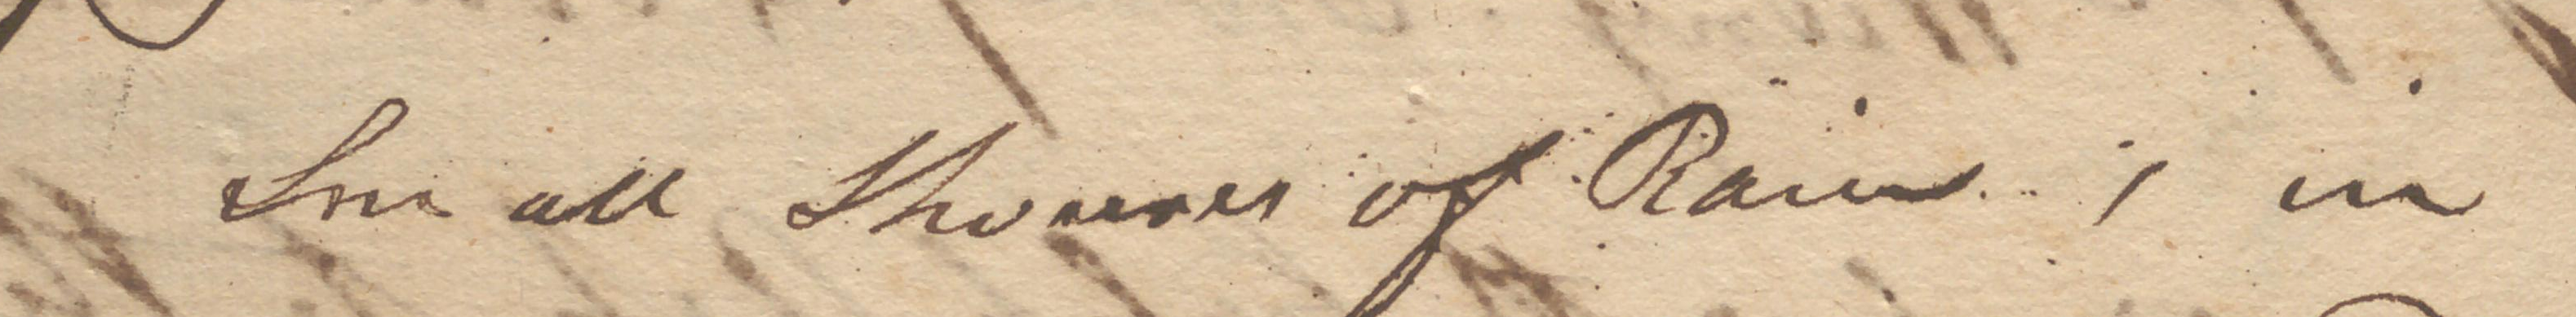Small Shoures of Rains in
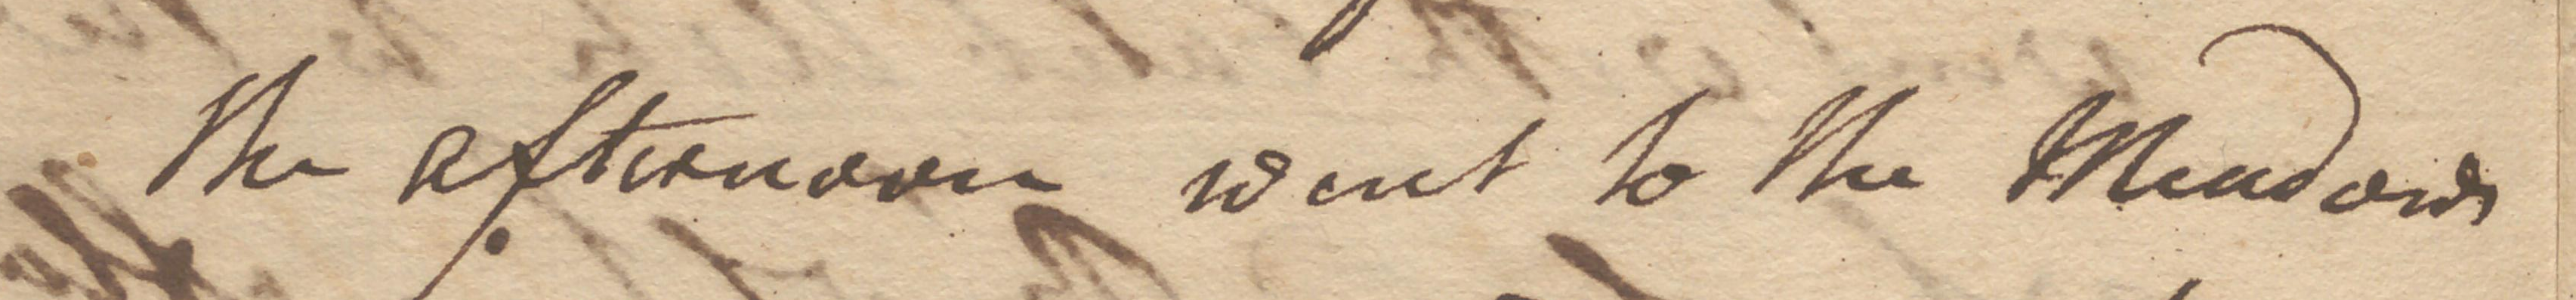the afternoon went to the Meadows
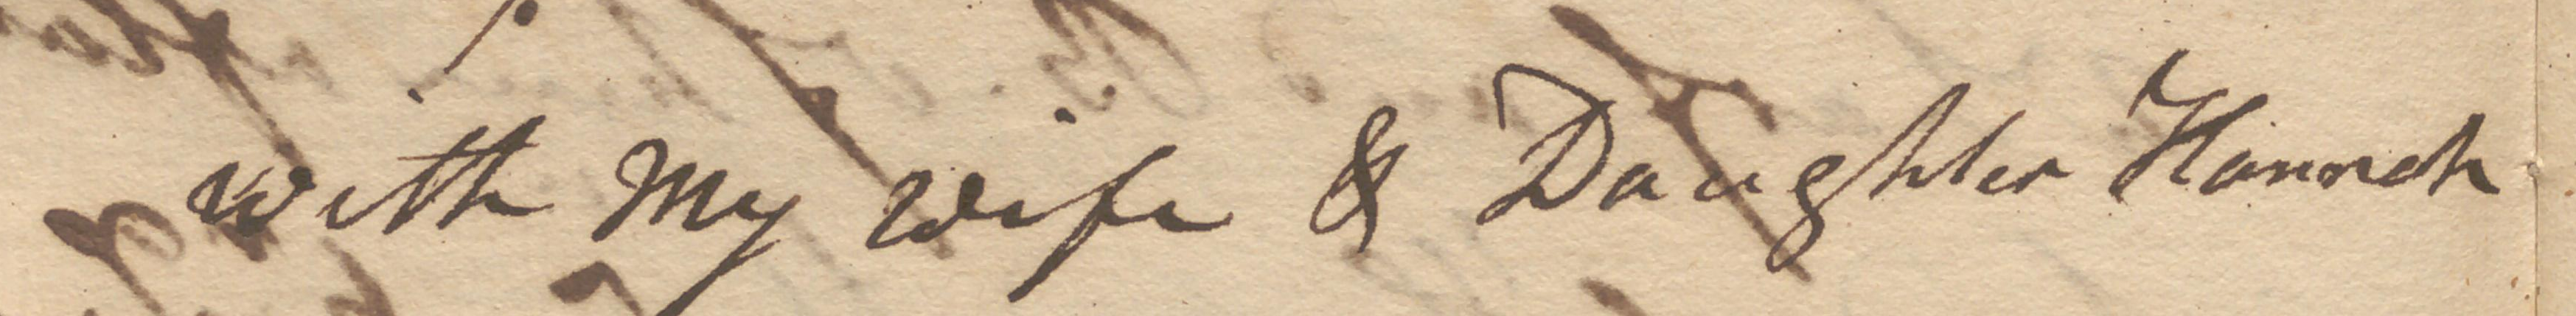with My wife & Daughter Hannah
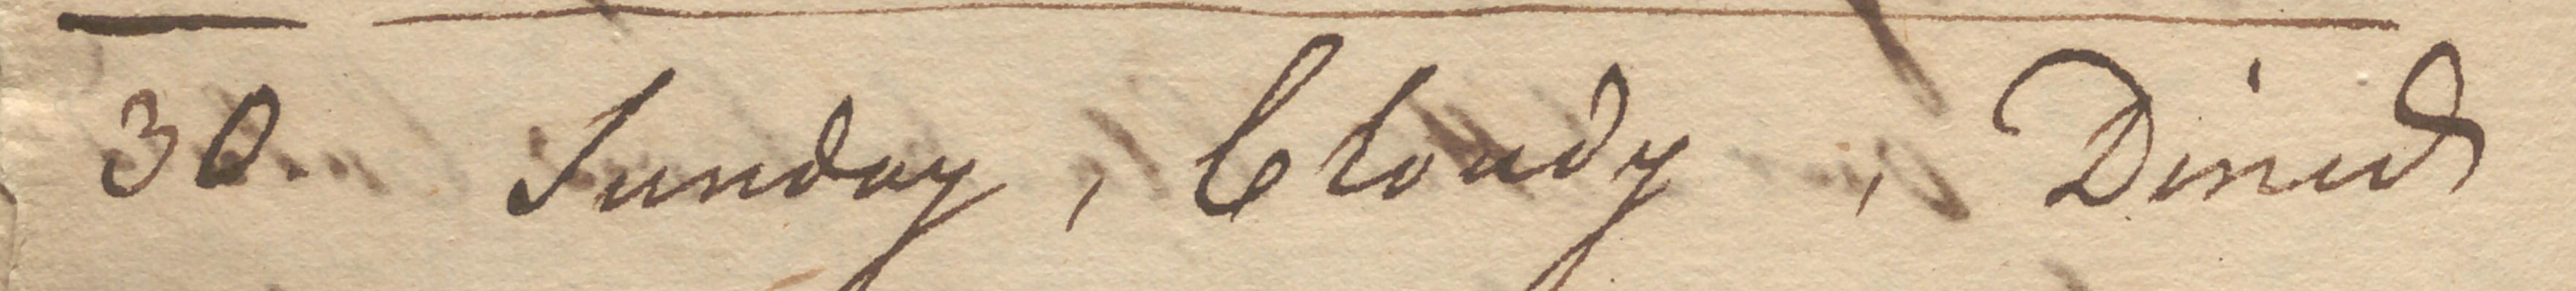30. Sunday, Cloudy, Dined
